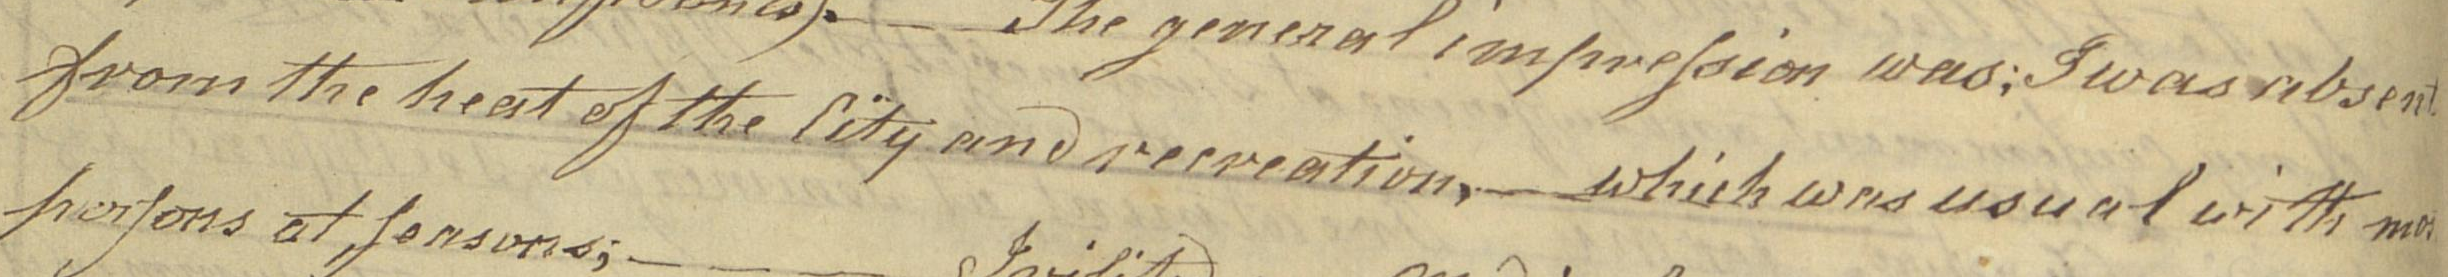from the heat of the City and recreation, which was usual with my
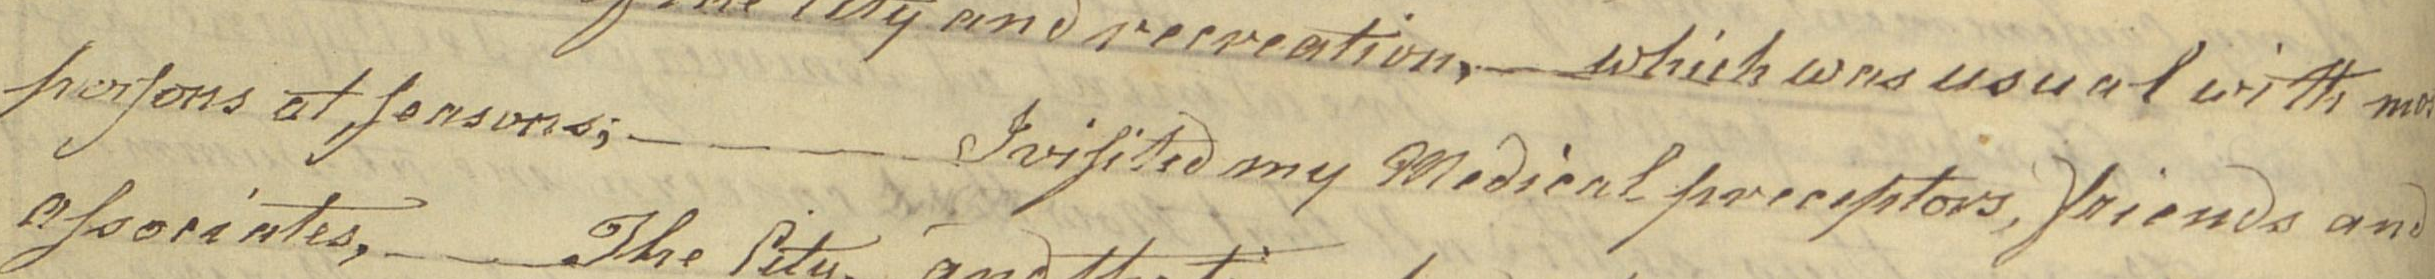persons of seasons; I assisted my Medical preceptors, friends and
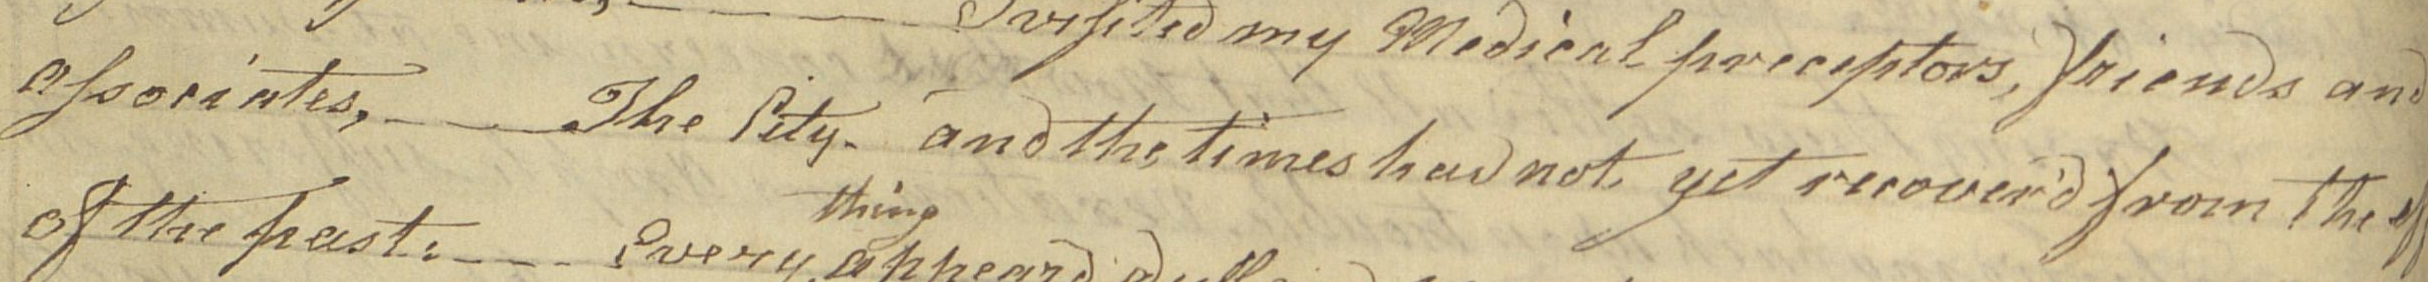associates, The City and the times had not yet recover'd from the s-
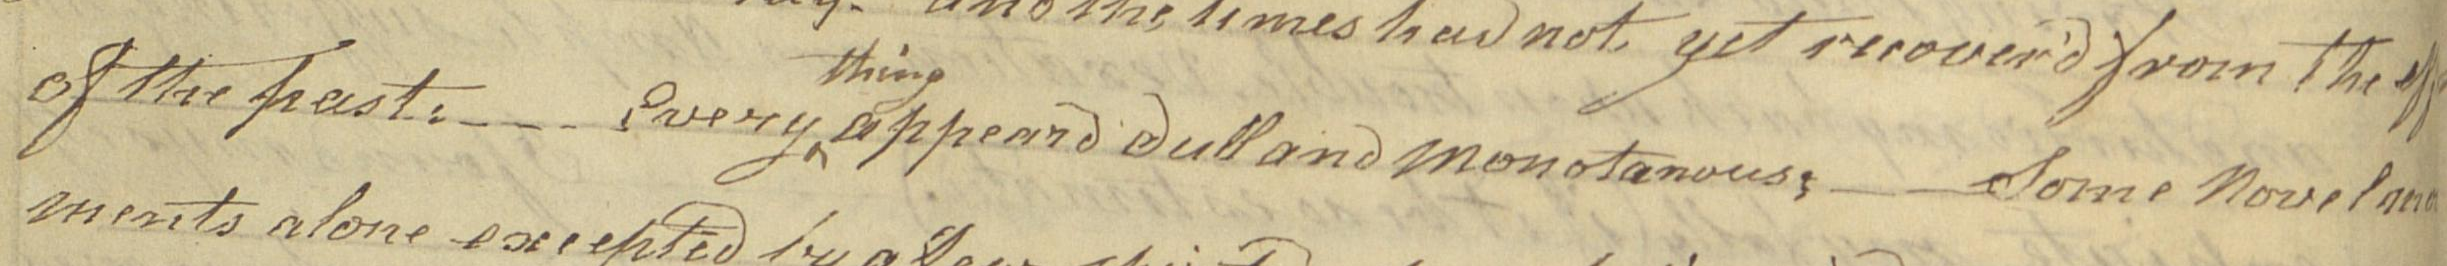of the past. Every ^ appeard dull and monotanous; Some Novel-
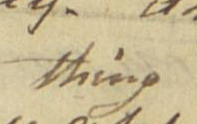thing
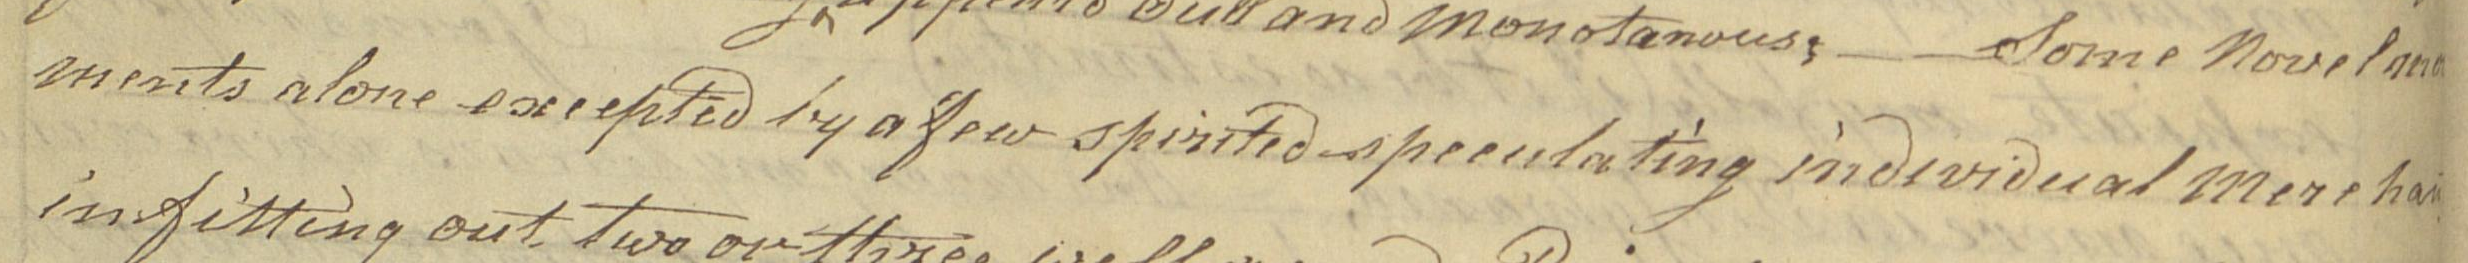-ments alone excepted by a few spirited speculating individual Mercha-
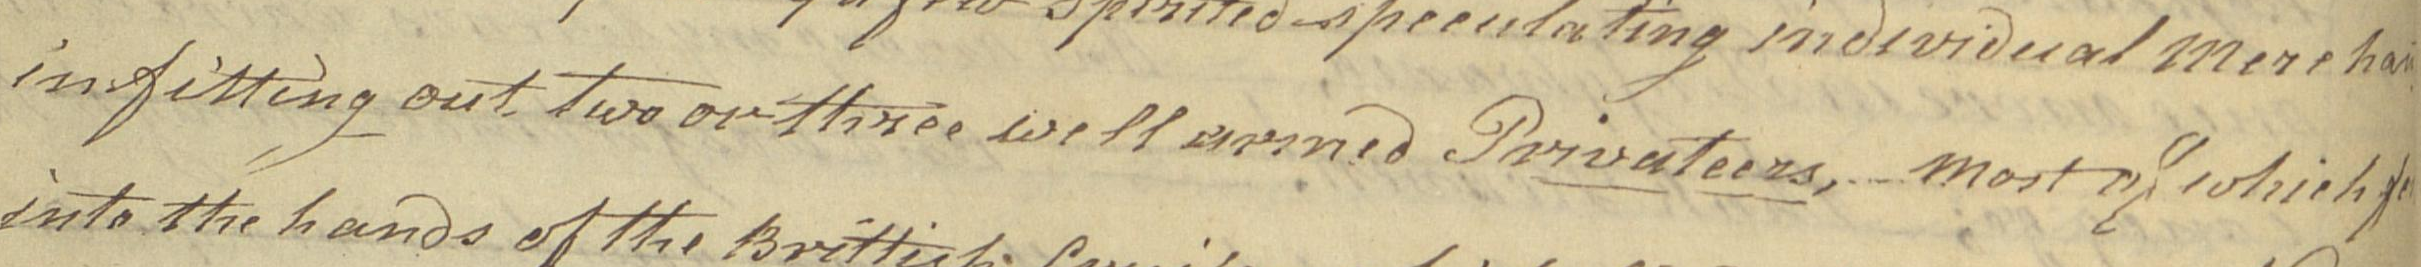in setting out two or three well armed Privateers, most of which f-
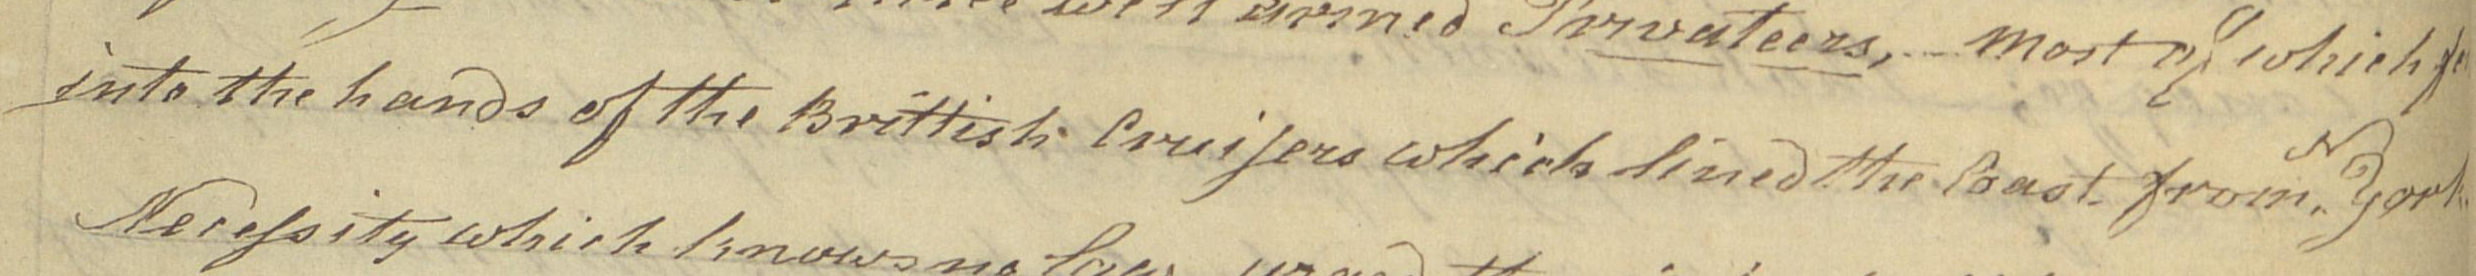into the bands of ths Brittish Cruisers which hired the Cast from ^ York
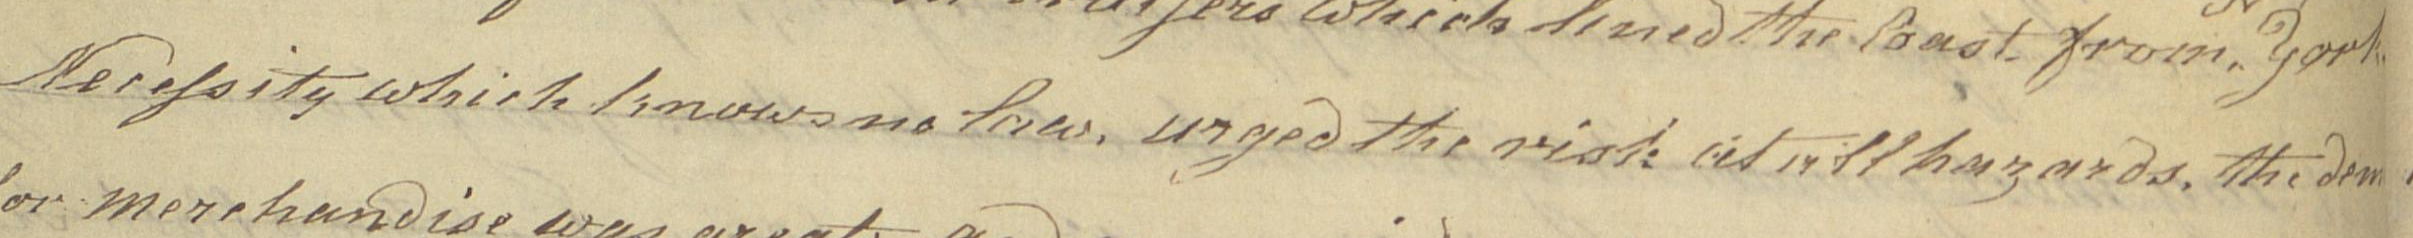Necessity which knows no law, urged the risk at all hazards, the dem-
